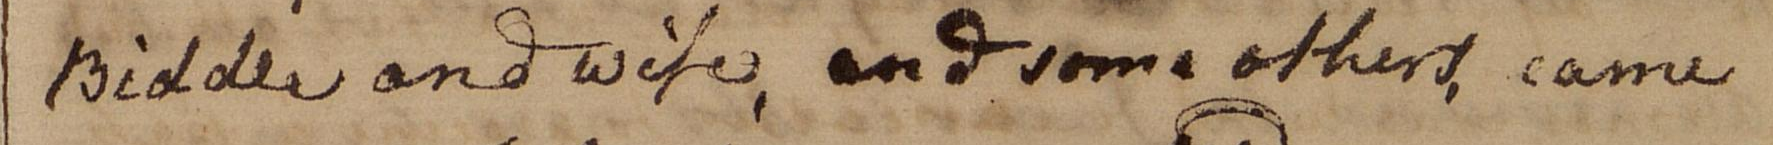Biddle and wife, and some others, came
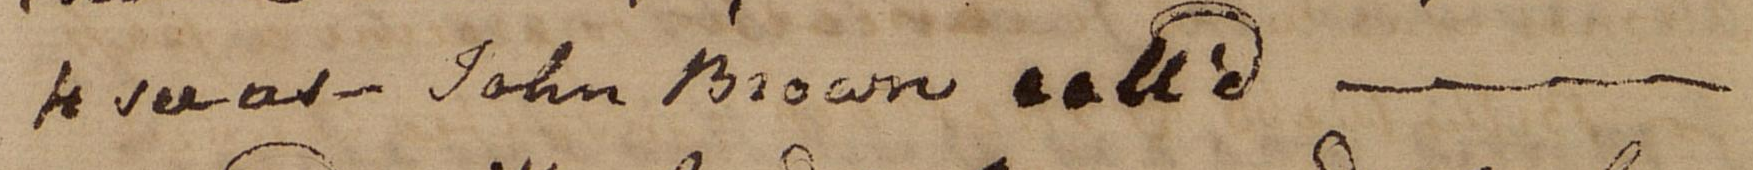to see us- John Brown call'd-
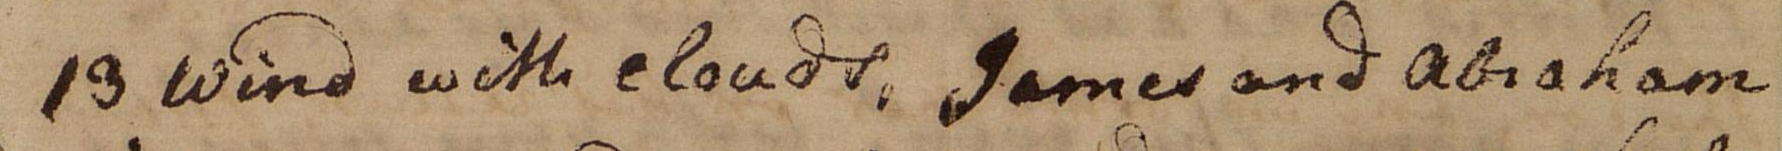13 wind with clouds, James and Abraham
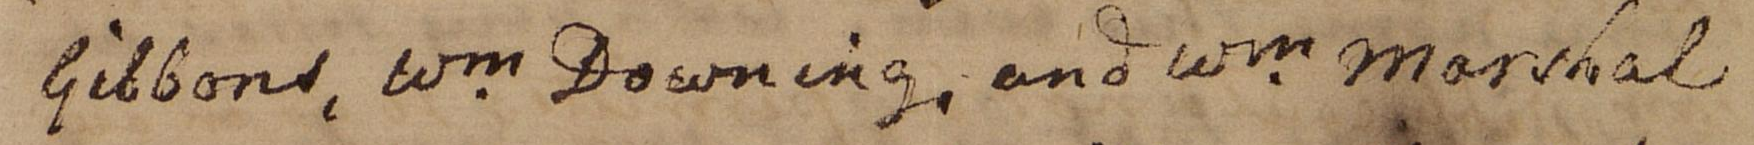Gibbons, W^m. Downing, and W^m. Marshal
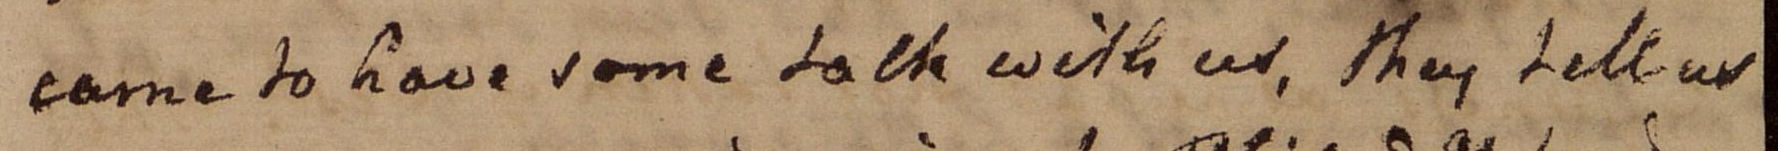came to have some talk with us, they tell us
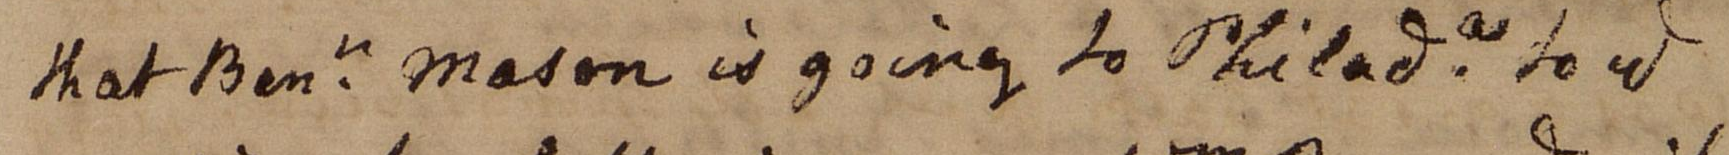that Ben^r. mason is going to Philad^a. to y^e
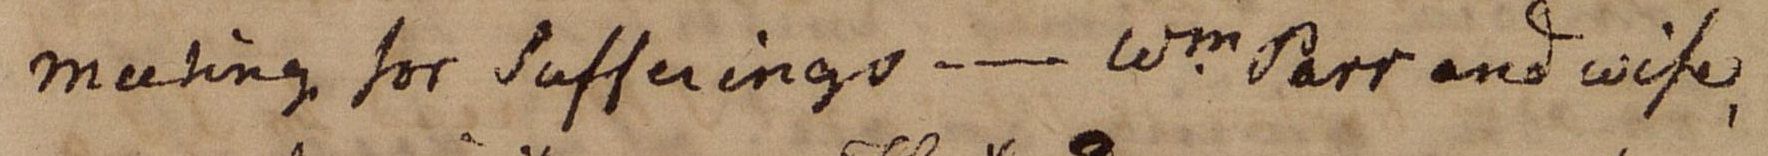meeting for sufferings- W^m. Parr and wife,
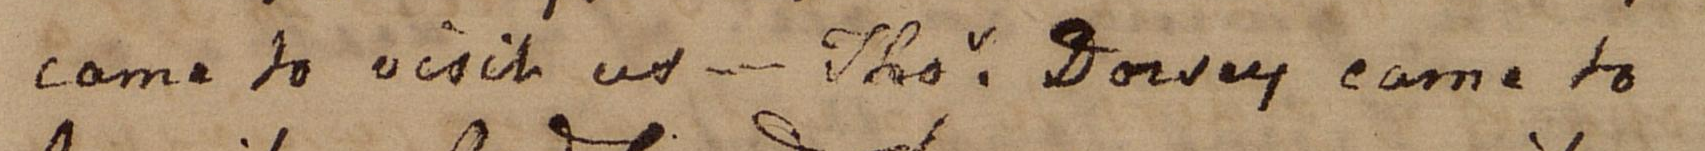came to visit us- Tho^s. Dorsey came to
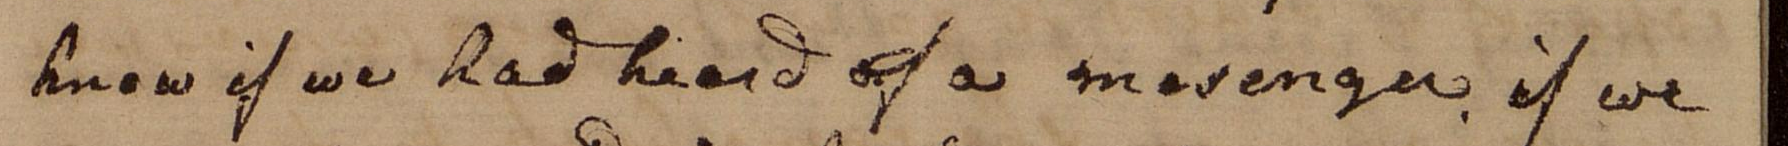know if we had heard of a mesenger, if we
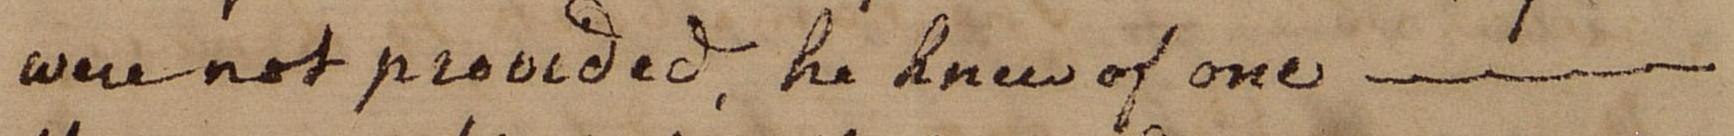were not provided, he knew of one-
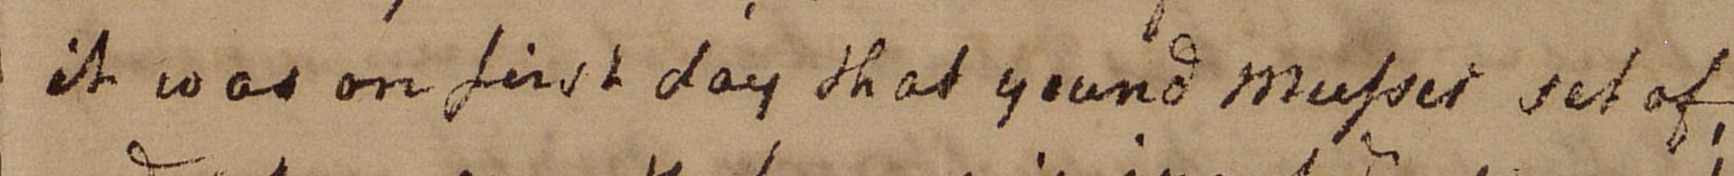it was on first day that yound Musser set of
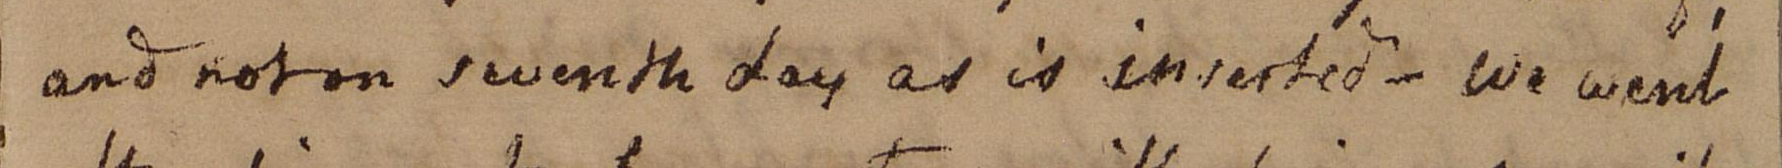and not on seventh day as is inserted- we went
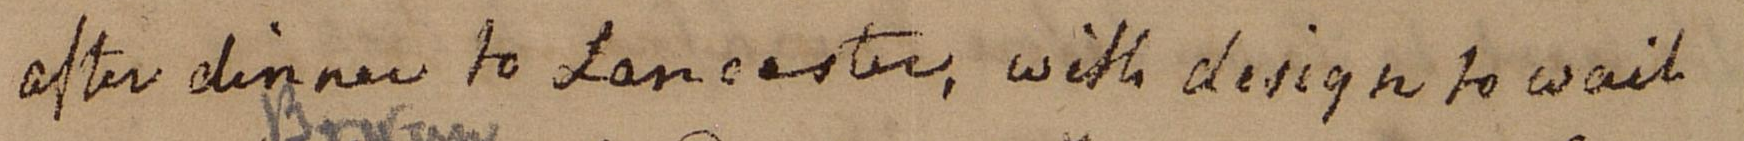after dinner to Lancaster, with design to wait
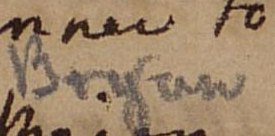Bryan
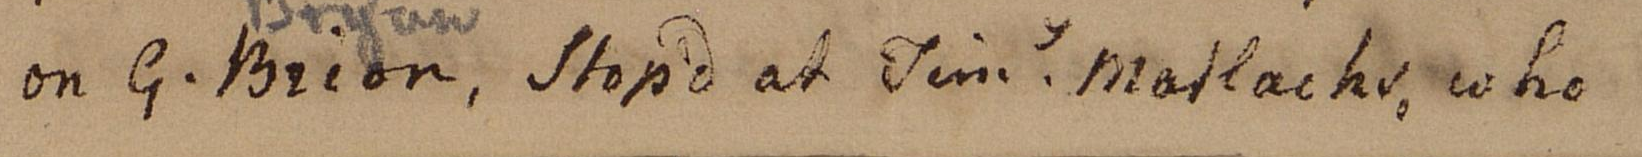on G. Brion, Stop'd at Tim^y. Matlacks, who
